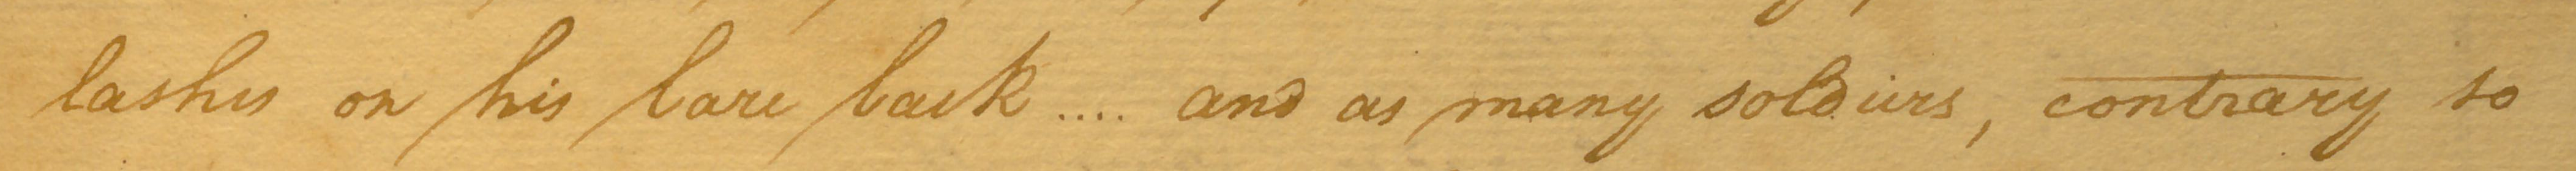lashes on his bare back.... and as many soldiers, contrary to
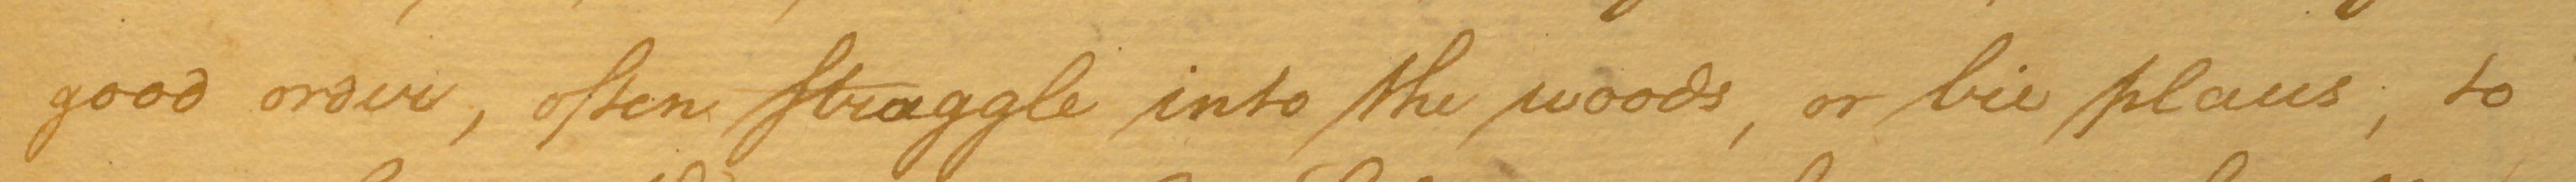good order, often straggle into the woods, or lie places, to
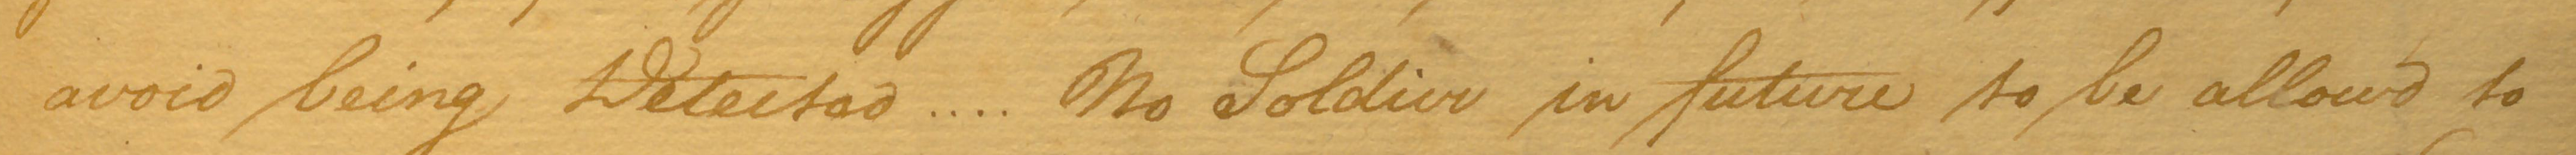avoid being Detected.... No soldier in future to be allowed to
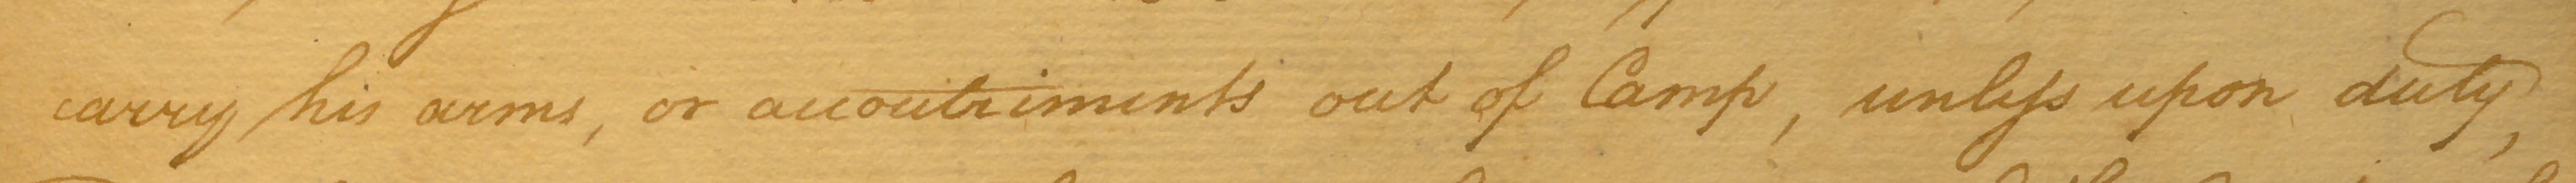carry his arms, or accoutriments out of Camp, unless upon duty,
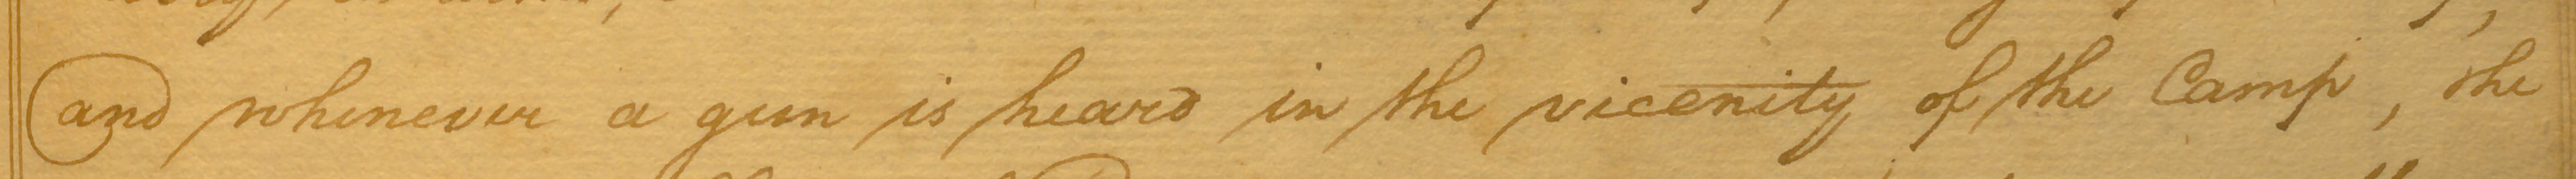and whenever a gun is heard in the vicenity of the Camp, the
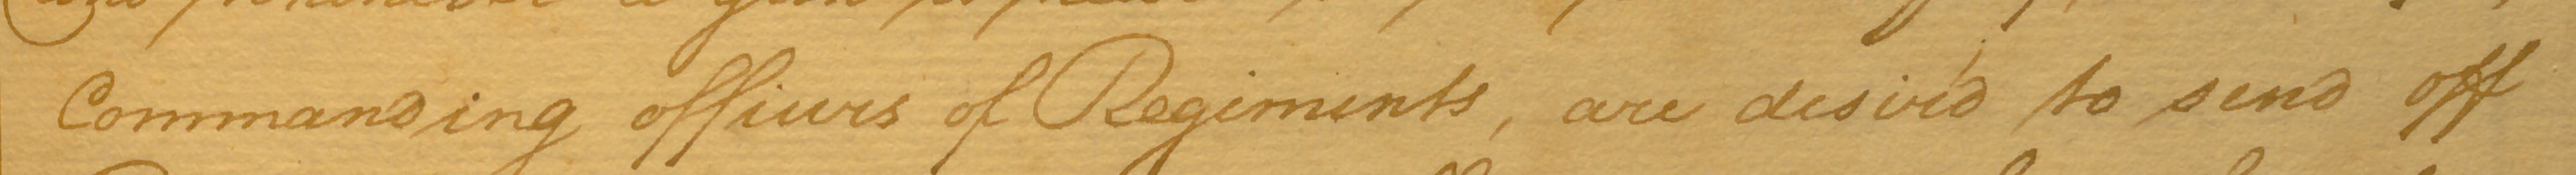Commanding officers of Regiments, are desir'd to send off
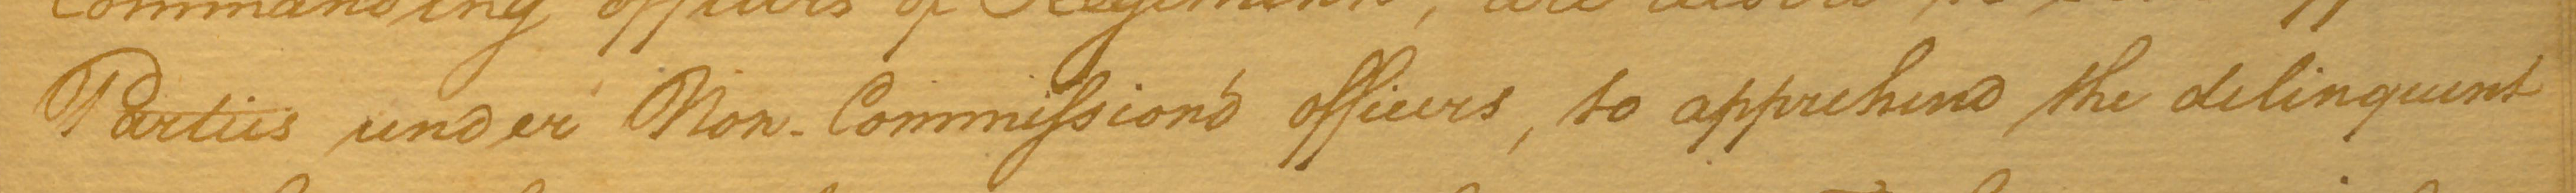Parties under Non-Commission'd officers, to apprehend the delinquent
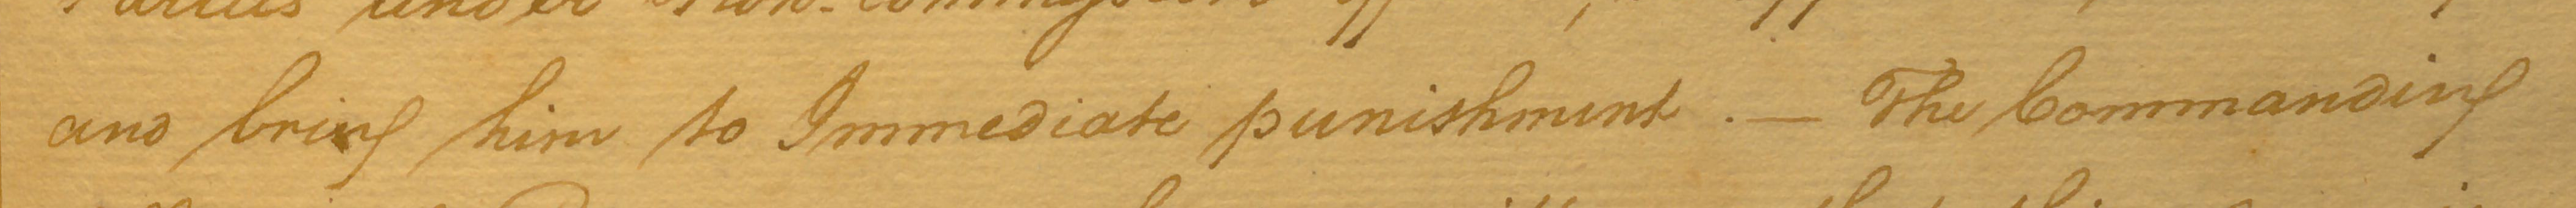and bring him to Immediate punishment.- The Commanding
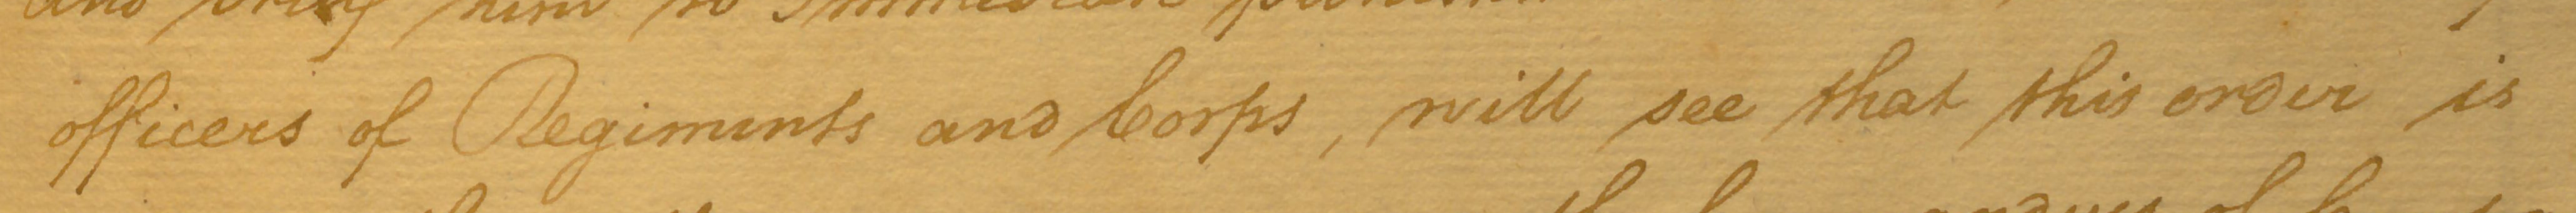officers of Regiments and Corps, will see that this order is
